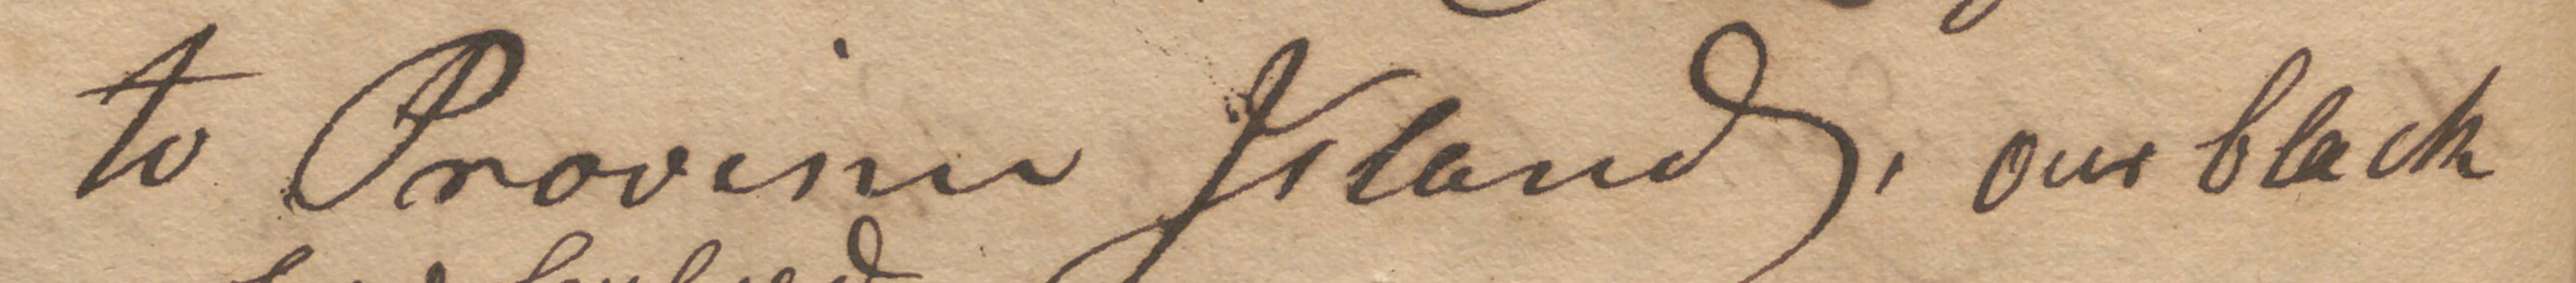to Provinice Island, our black
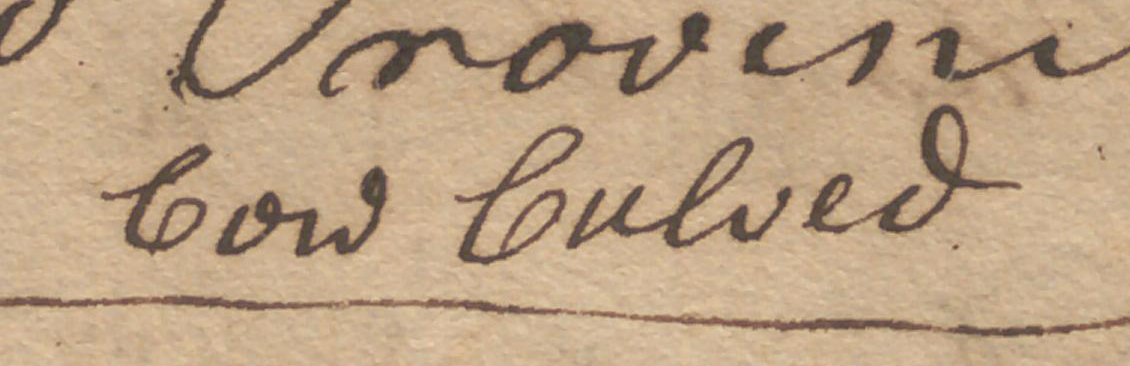Cow Calved
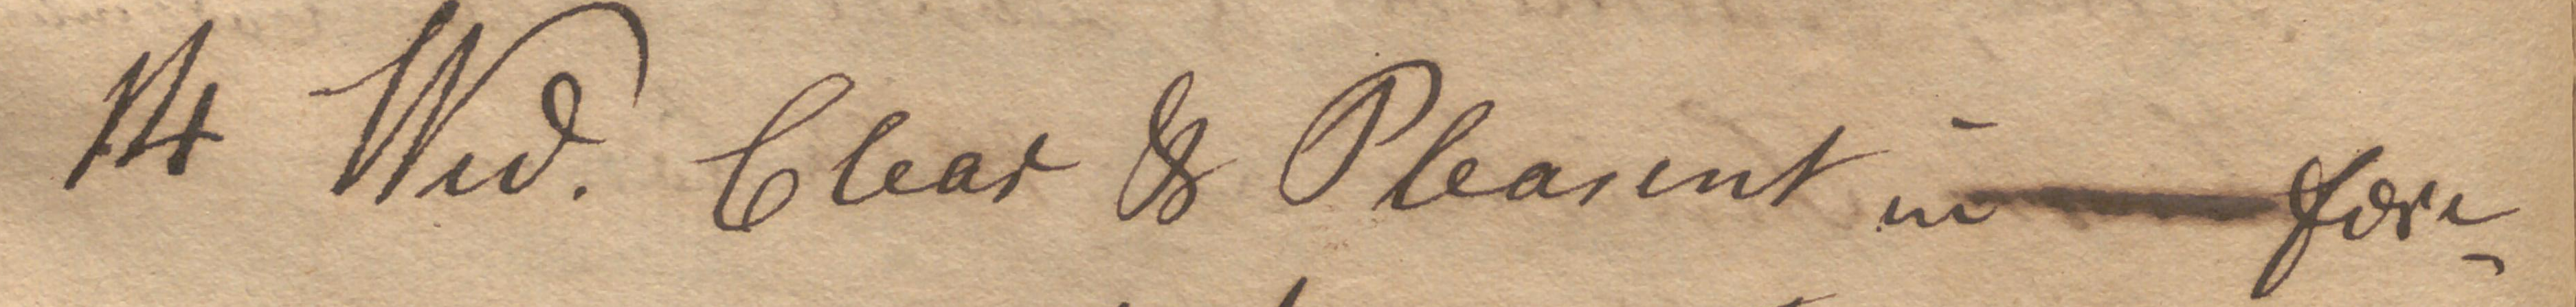14 Red. Cleat & Pleasent in fore
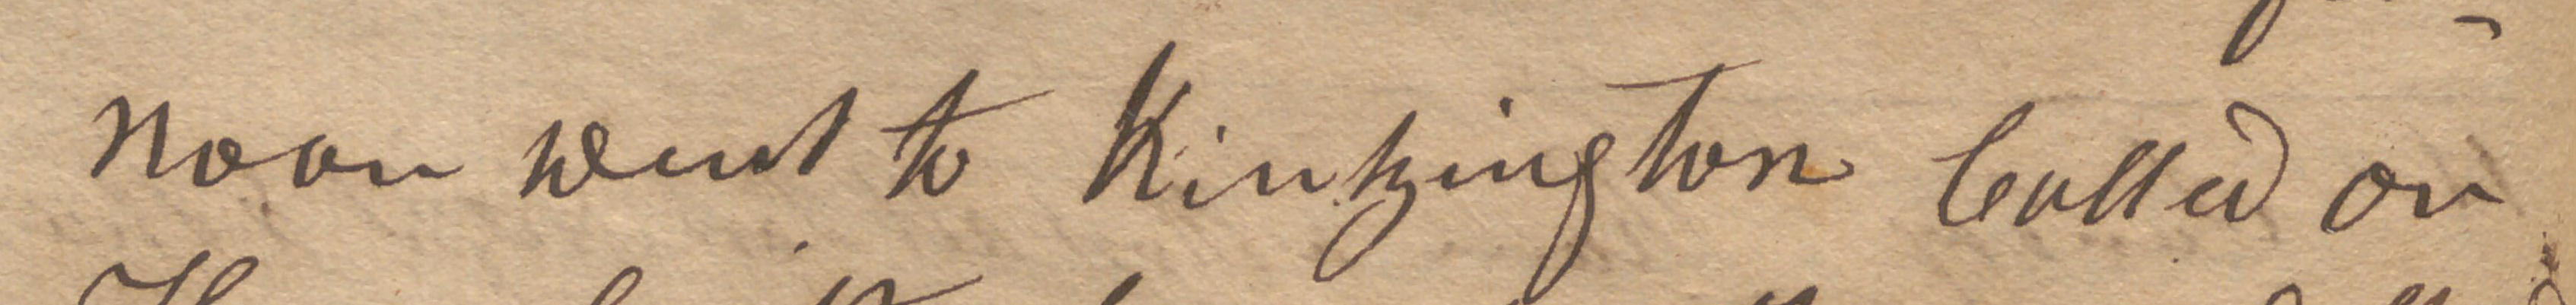noon went to Kintzington Called on
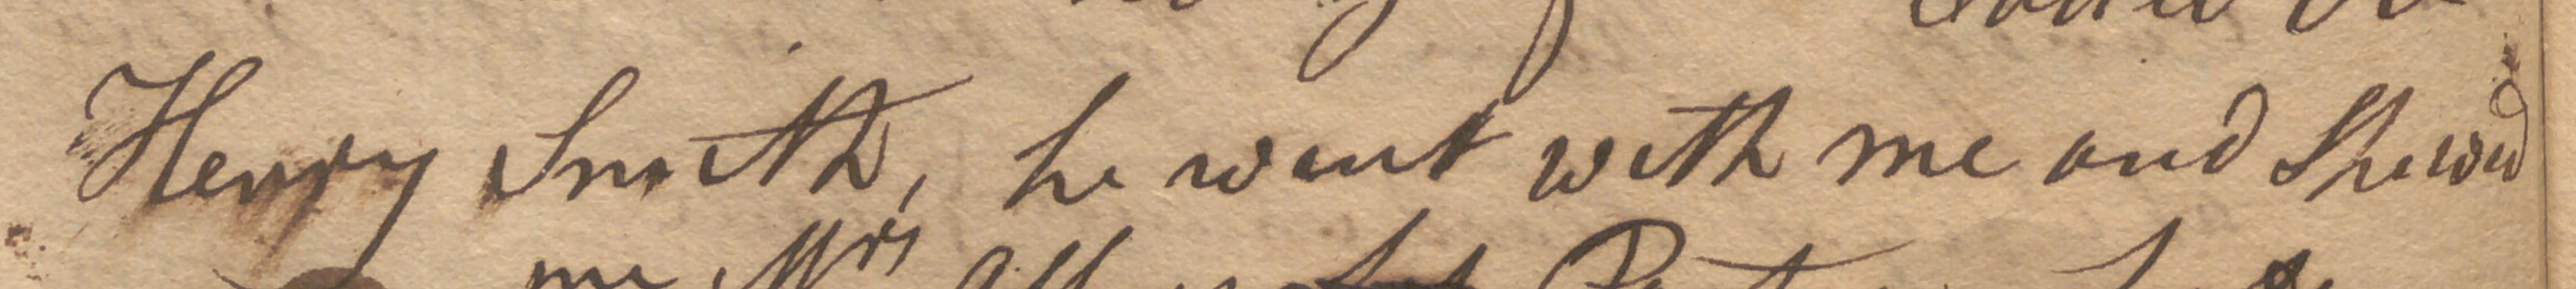Hery Smith, he went with me and Shewed
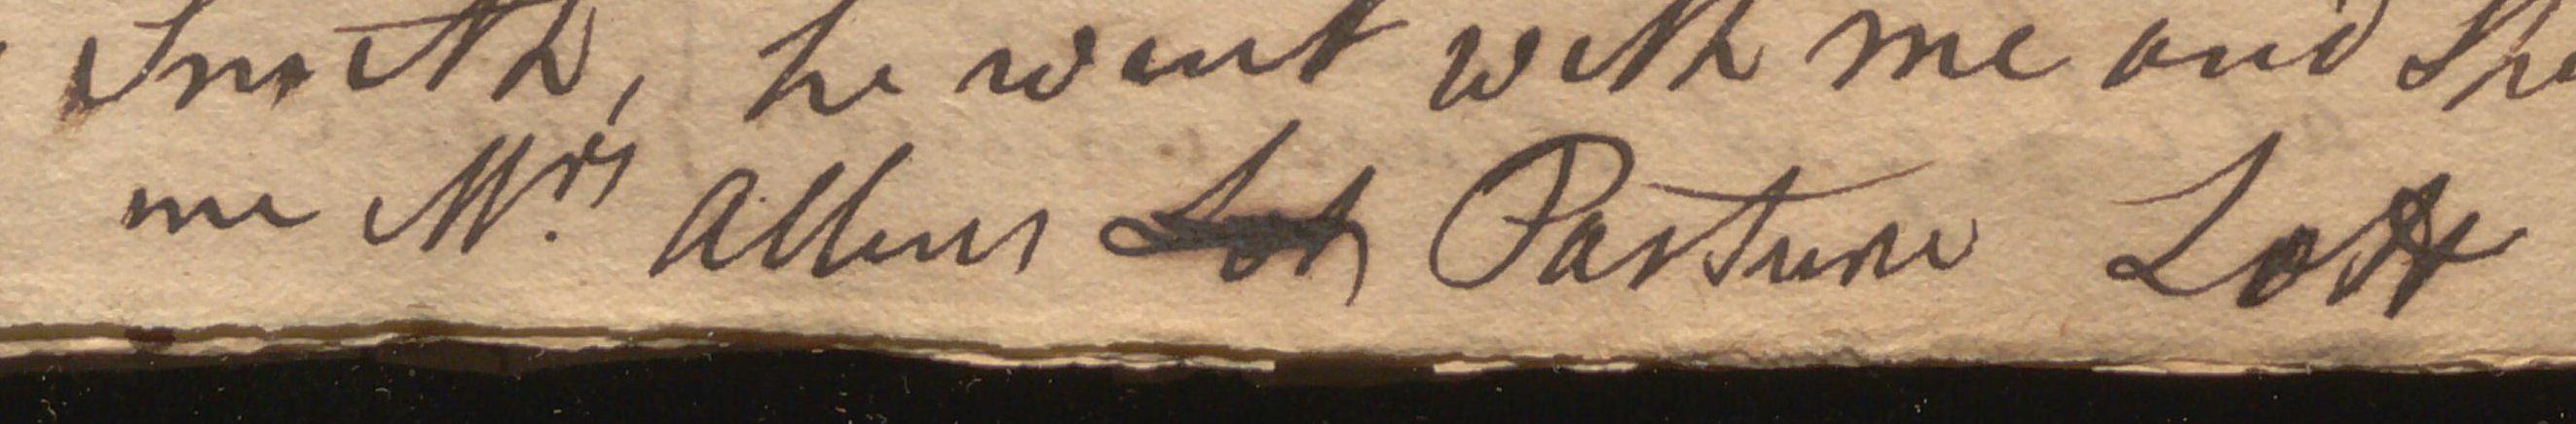me M^r. Allens [Lot] Pasture Lott
